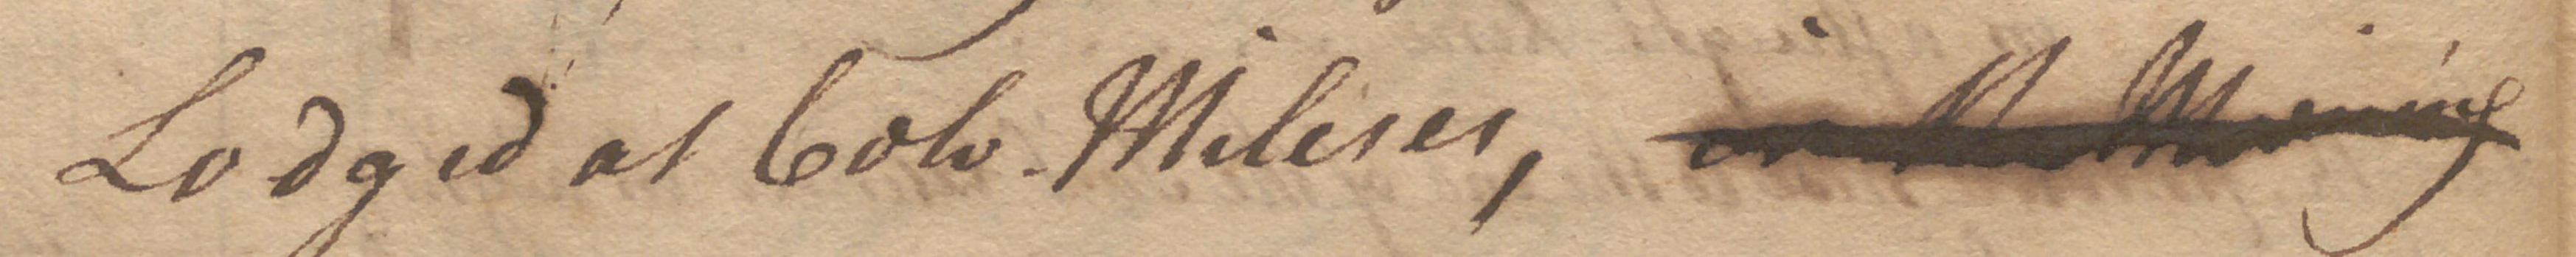Lodged at Colo. Mileses, [in the Morning]
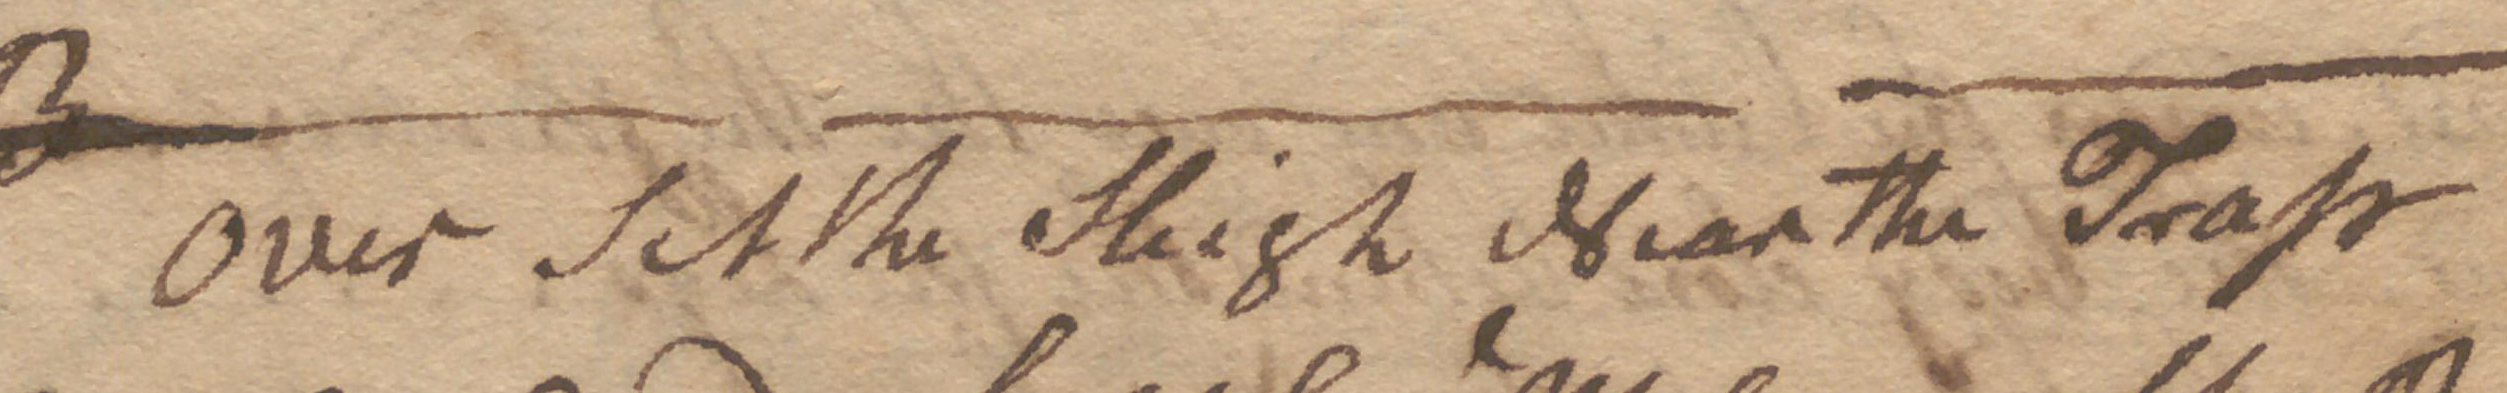over Set the Sleigh Near the Trap
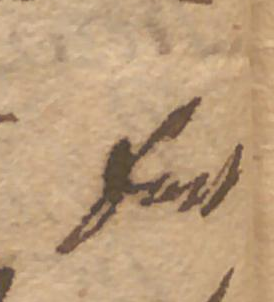fast
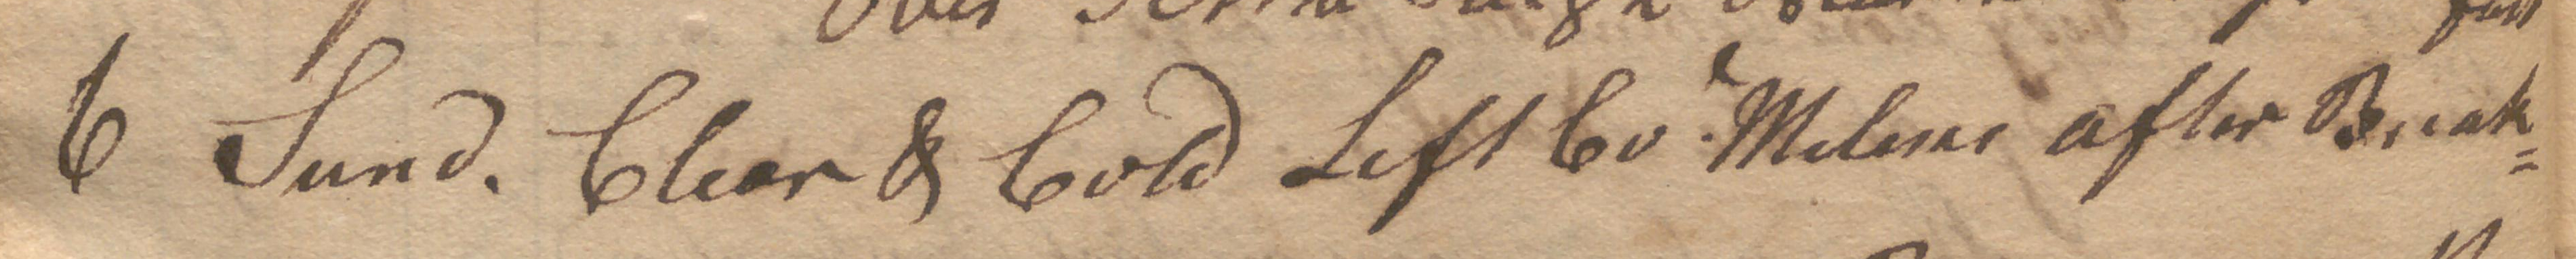6 Sund. Clear & Cold Left Co^l. Mileses after Break-
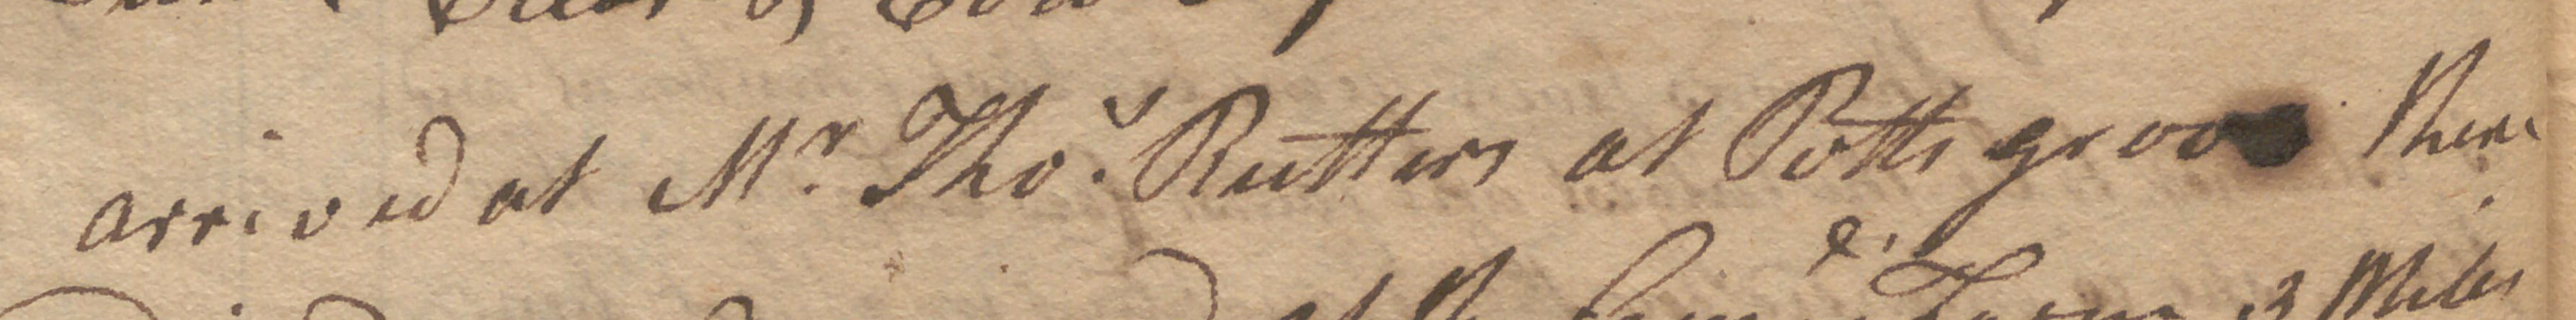arrived at M^r. Tho^s. Rutters at Potts grove then
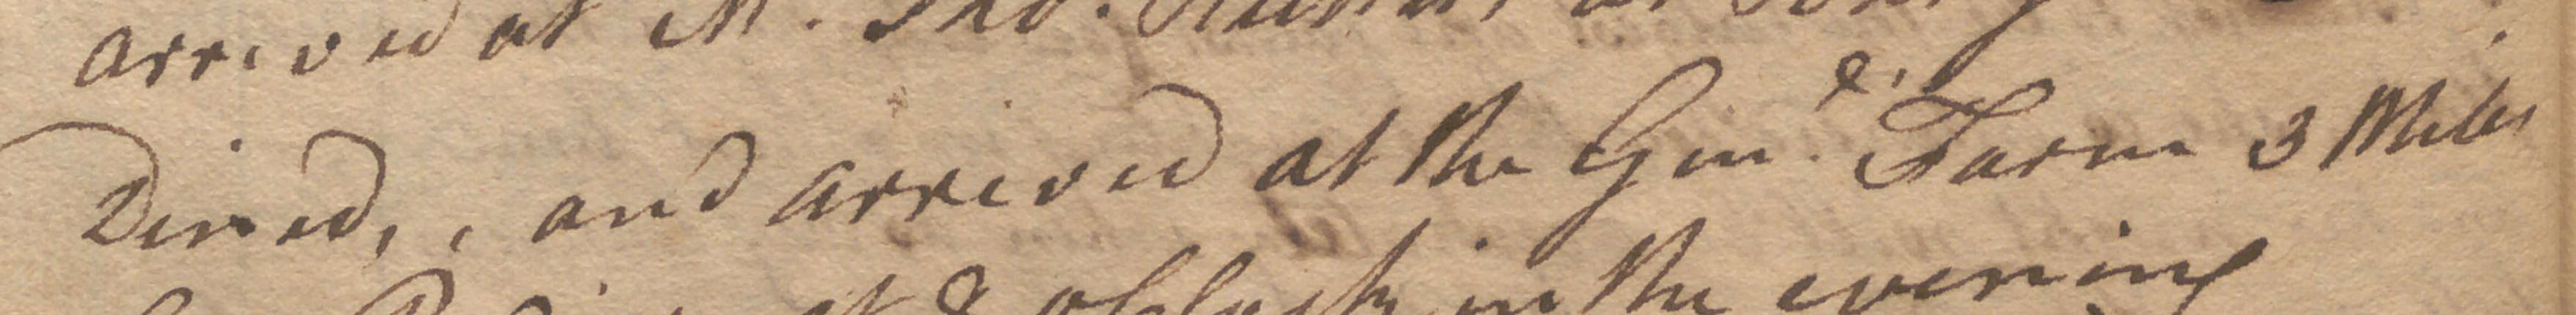Dined,, and arrived at the Gen^l. Farm 3 Miles
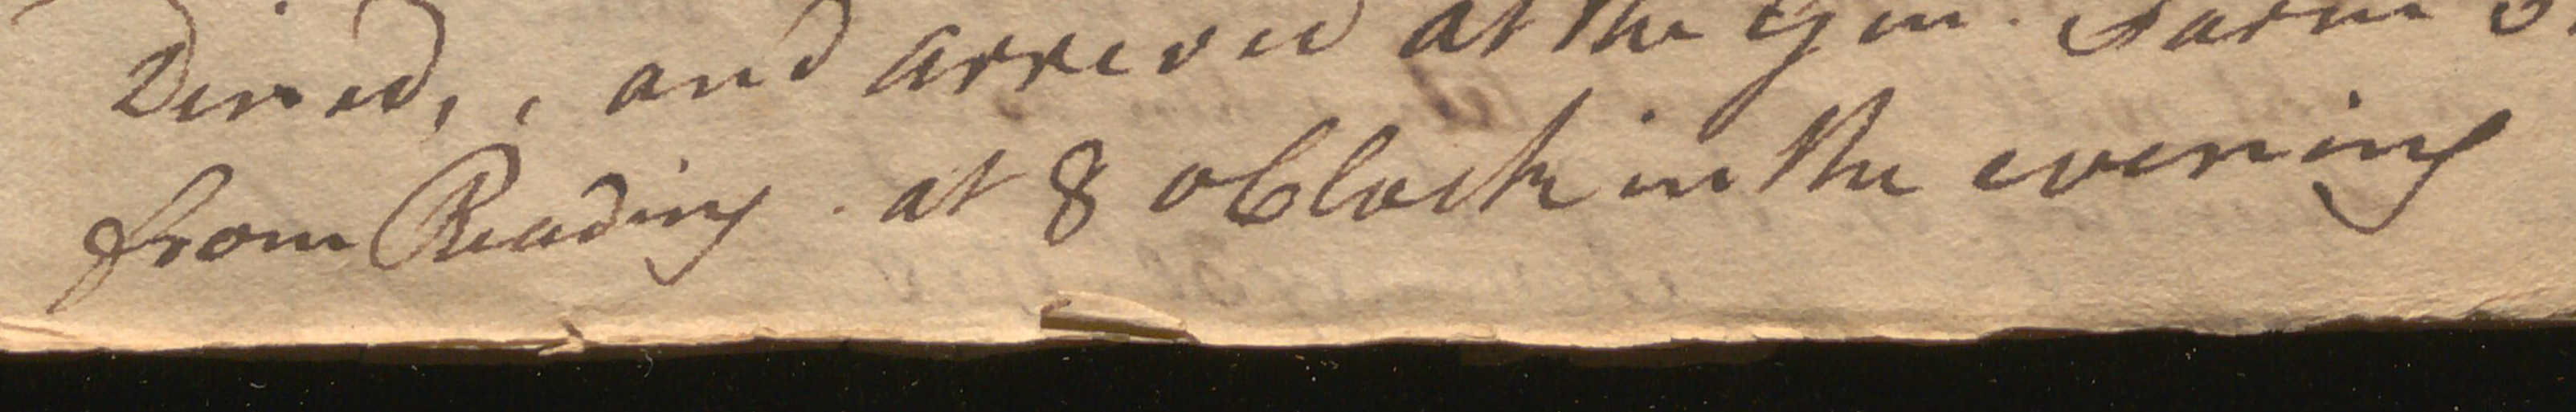from Reading at 8 ^oClock i the evening
